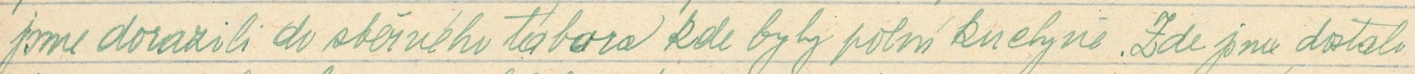jsme dorazili do sběrného tábora kde byly polní kuchyně. Zde jsme dostali
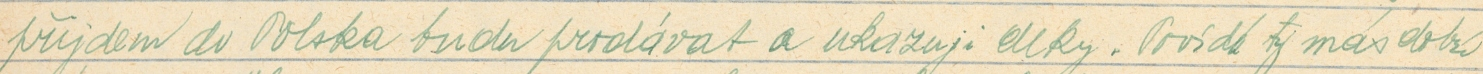přijdem do Polska budu prodávat a ukazuji deky. Povídá ty más dobré
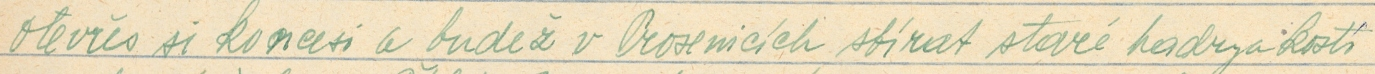otevřes si koncesi a budež v Prosenicích sbírat staré hadry a kostí
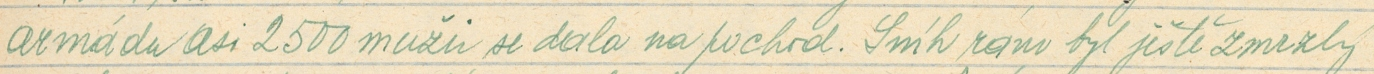armáda asi 2500 mužů se dala na pochod. Sníh ráno byl ještě zmrzlý
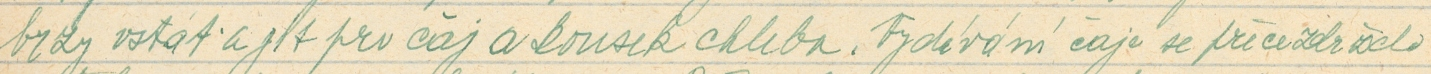brzy vstát a jít pro čaj a kousek chleba. Vydávání čaje se přece zdrželo
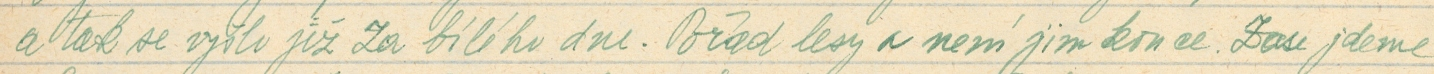a tak se vyšlo již za bílého dne. Pořád lesy a není jim konce. Zase jdeme
